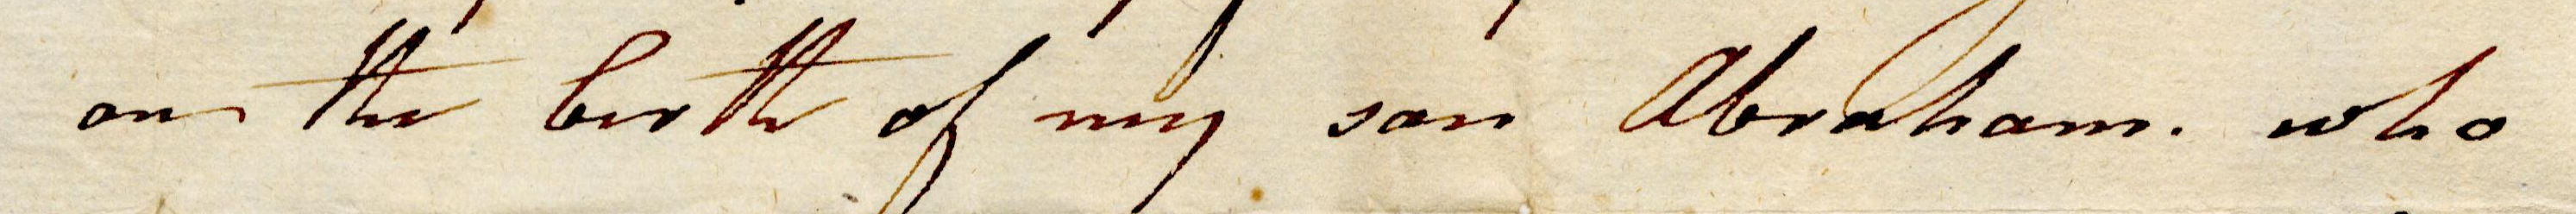on the birth of my son Abraham who
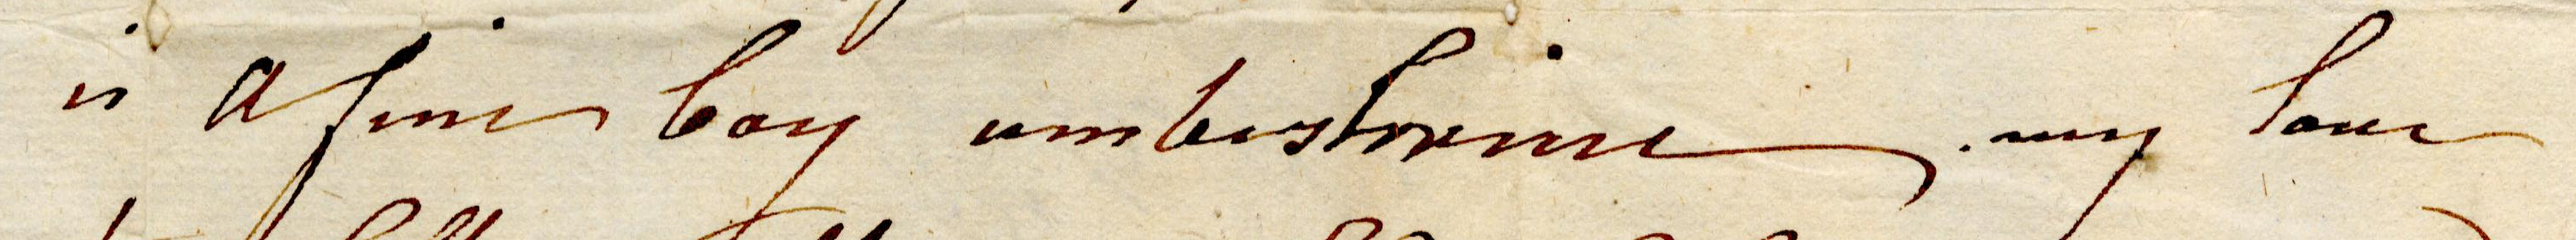is a fine boy umbestrime my love
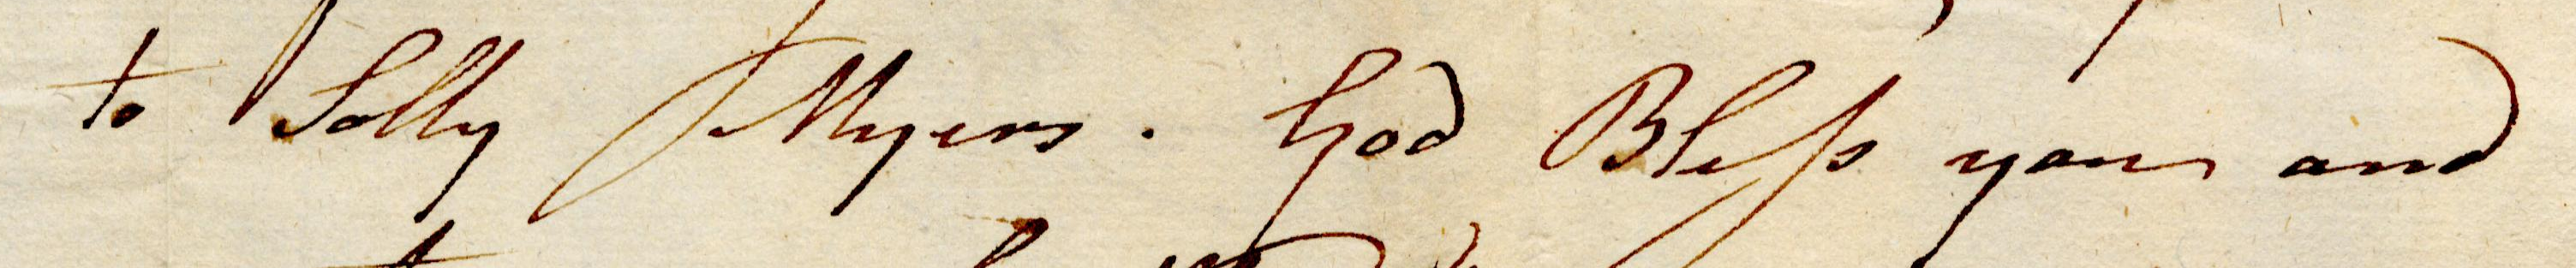to Sally Myers. God Bless you and
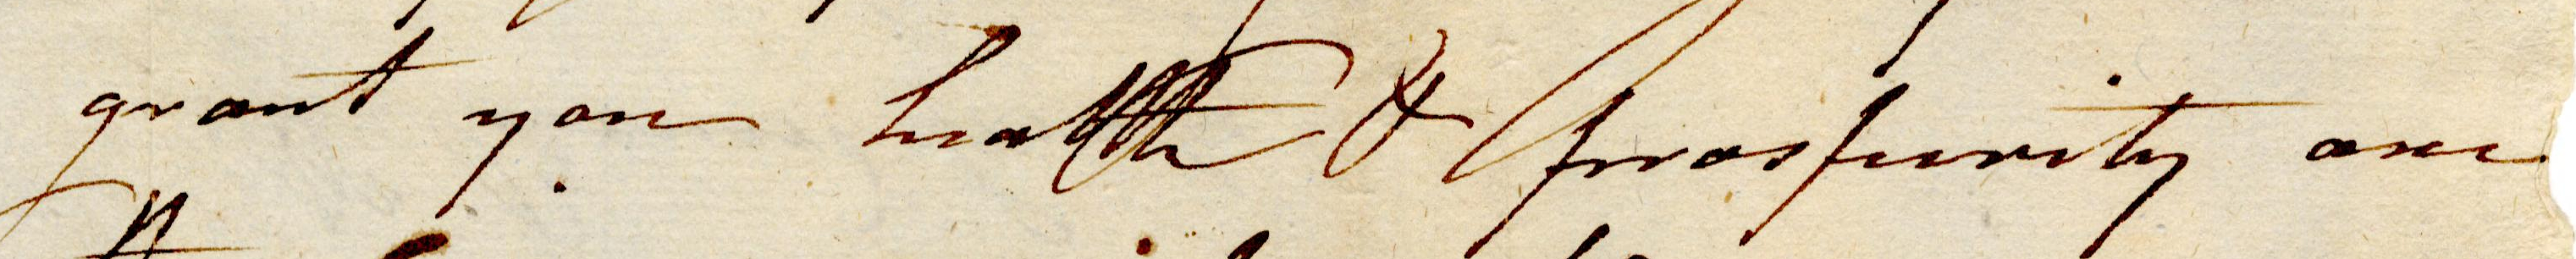grant you health & prosperity are
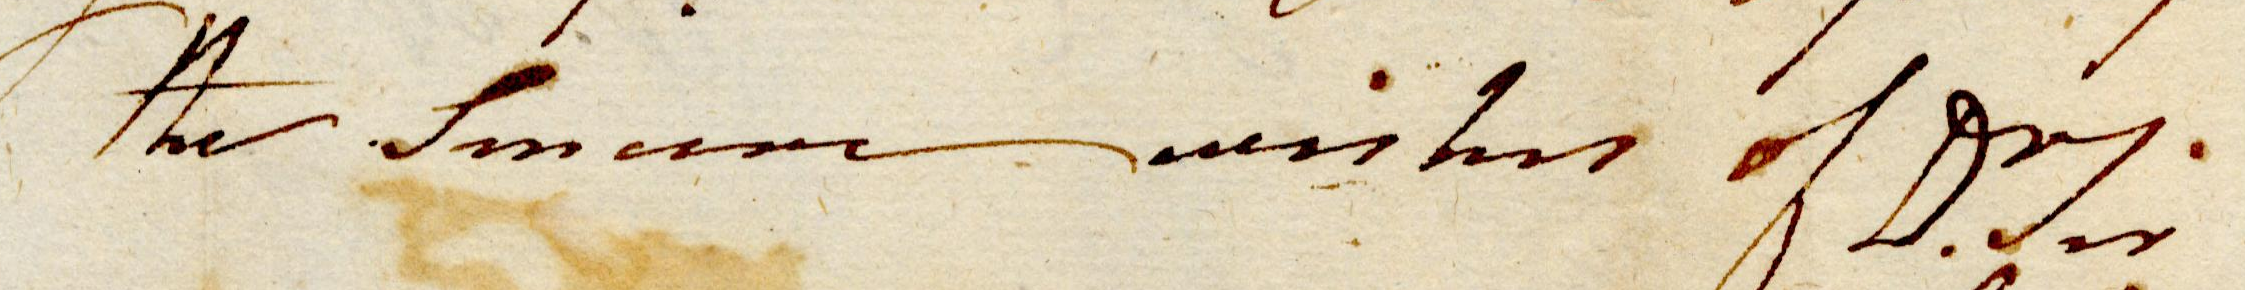the sincere wishes of D^r. Sir
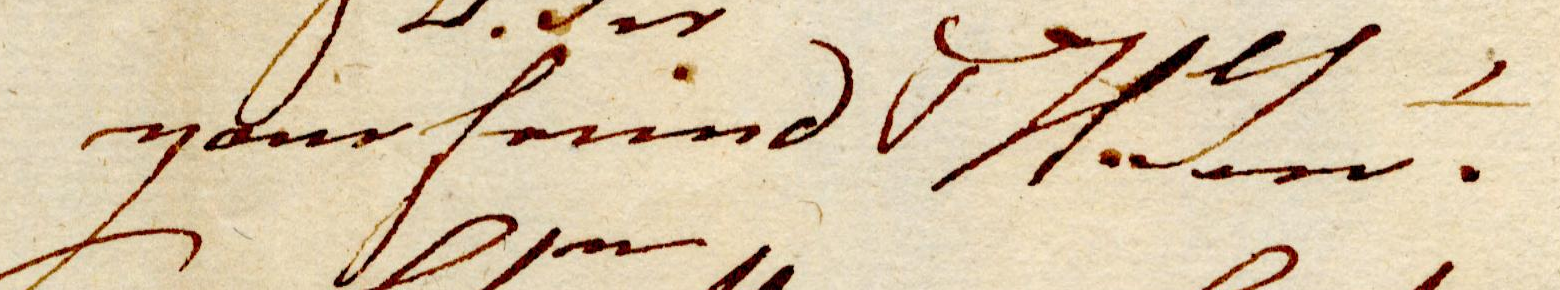your friend & H.^l serv^t
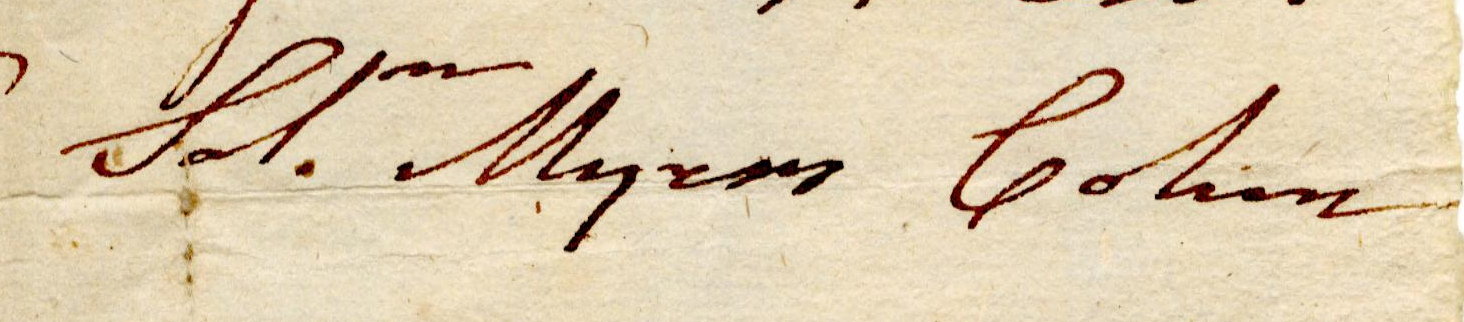Sol^m Myers Cohen
